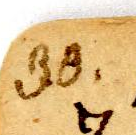38
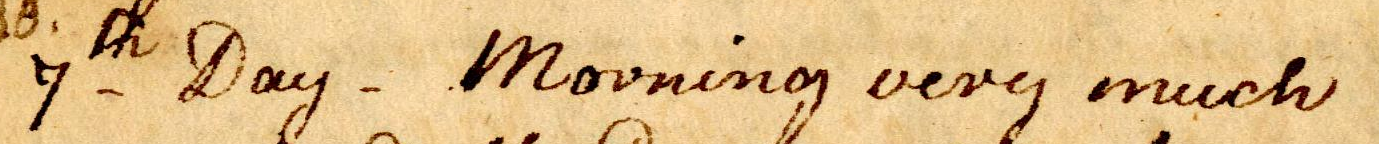7^th Day- Morning very much
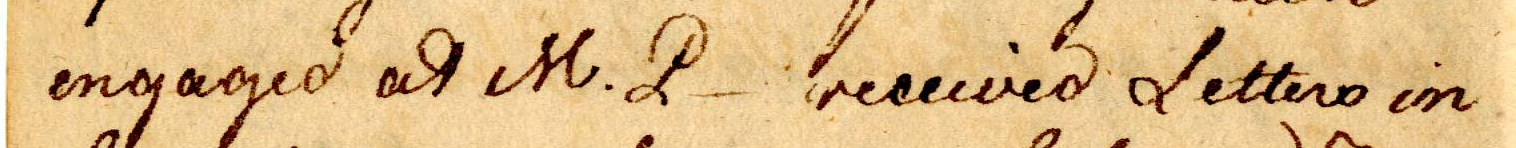engaged at M.P- received Letters in
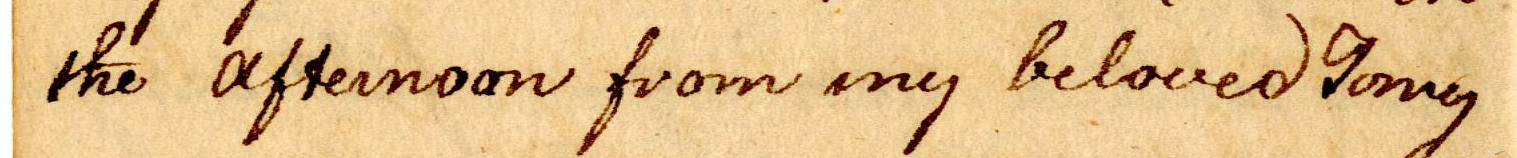the Afternoon from my beloved Tomy
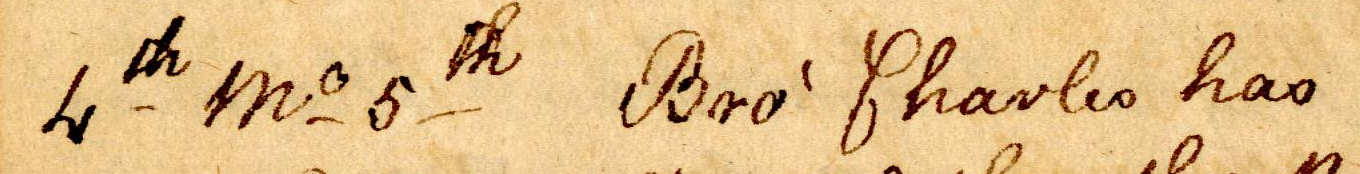4^th M^o 5^th Bro' Charles has
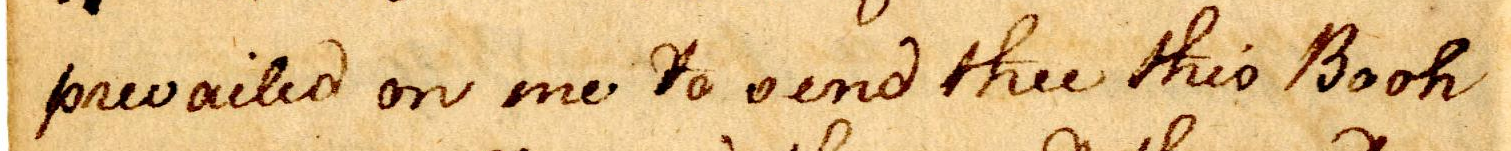prevailed on me to send thee this Book
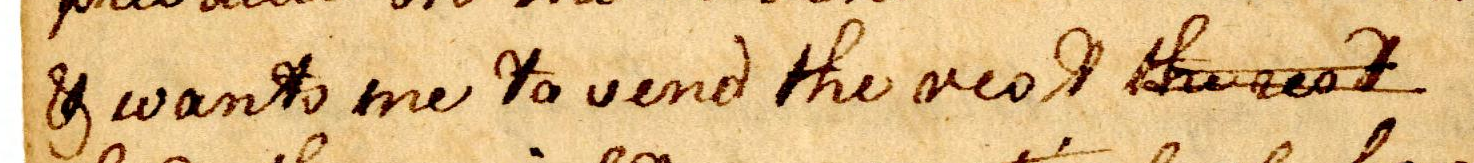& wants me to send the rest the rest
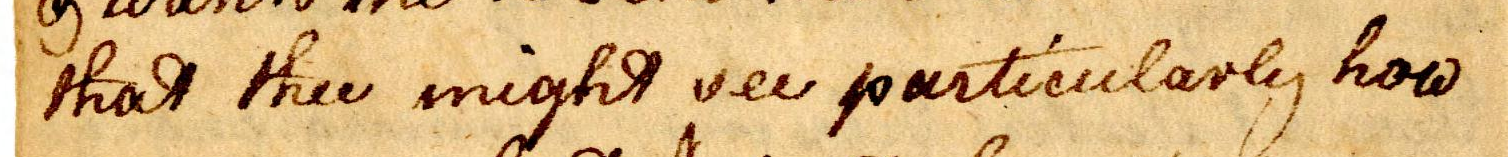that thee might see particularly how
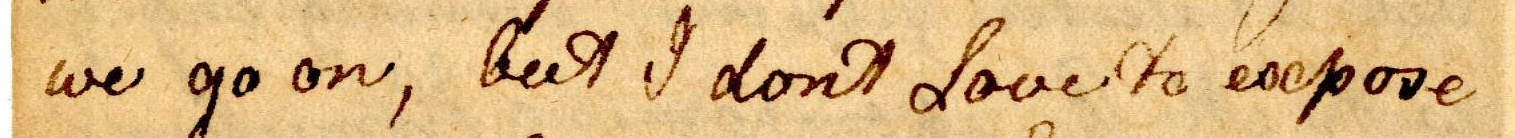we go on, but I dont Love to expose
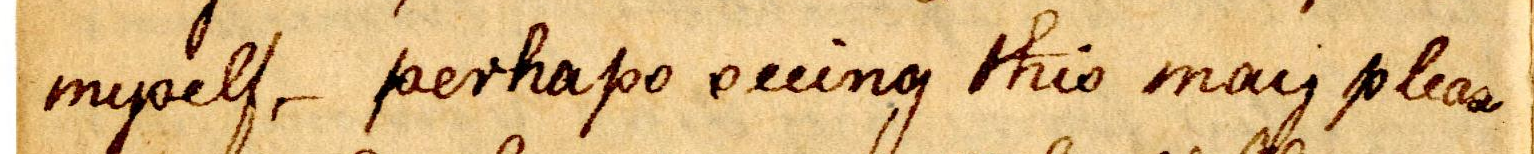myself- perhaps seeing this may pleas
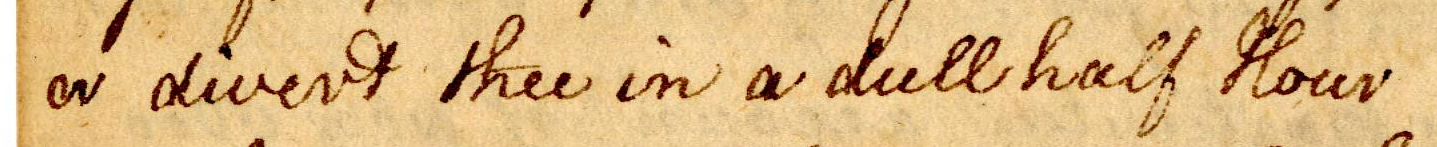or divert thee in a dull half Hour
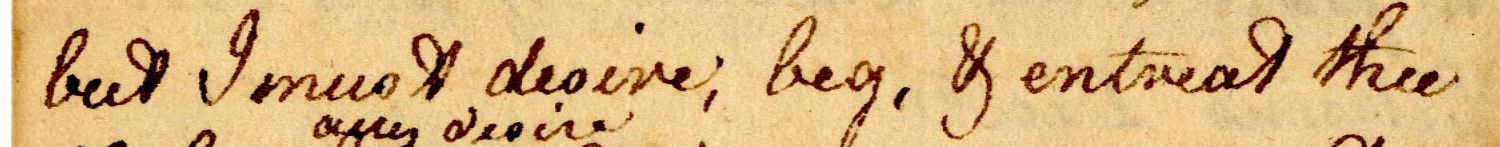but I must desire, beg, & entreat thee
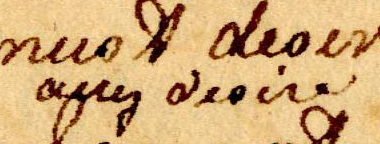any desire
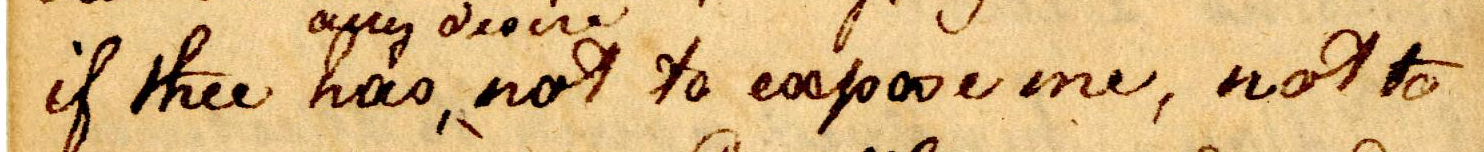if thee has ^ not to expose me, not to
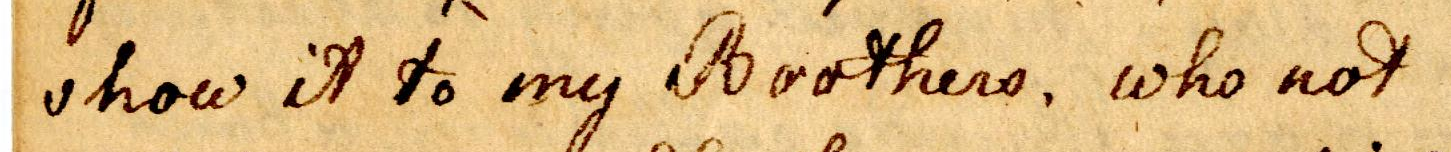show it to my Brothers, who not
